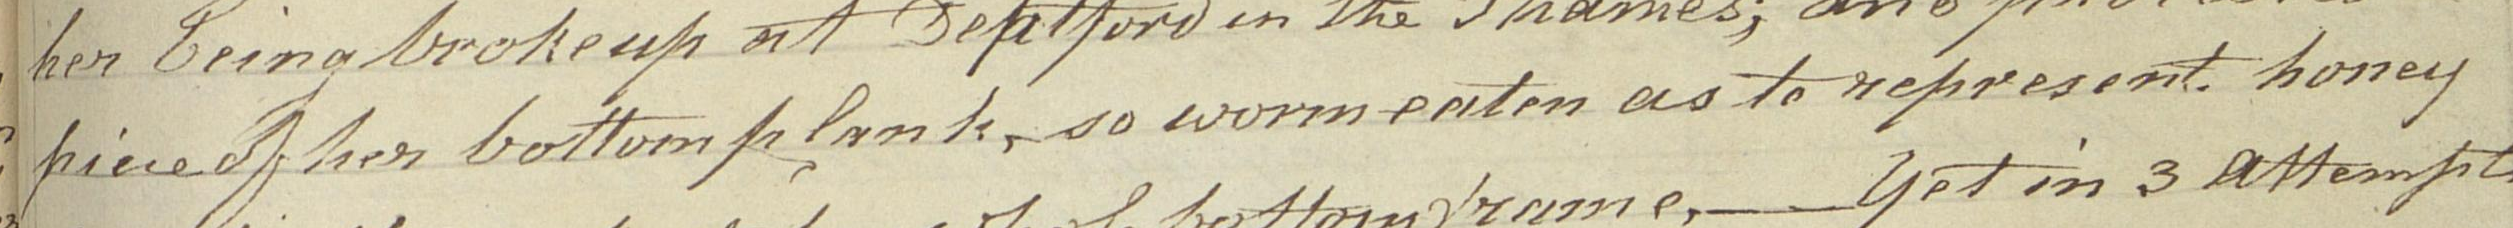piece of her bottom plank, so worm eaten as to represent honey
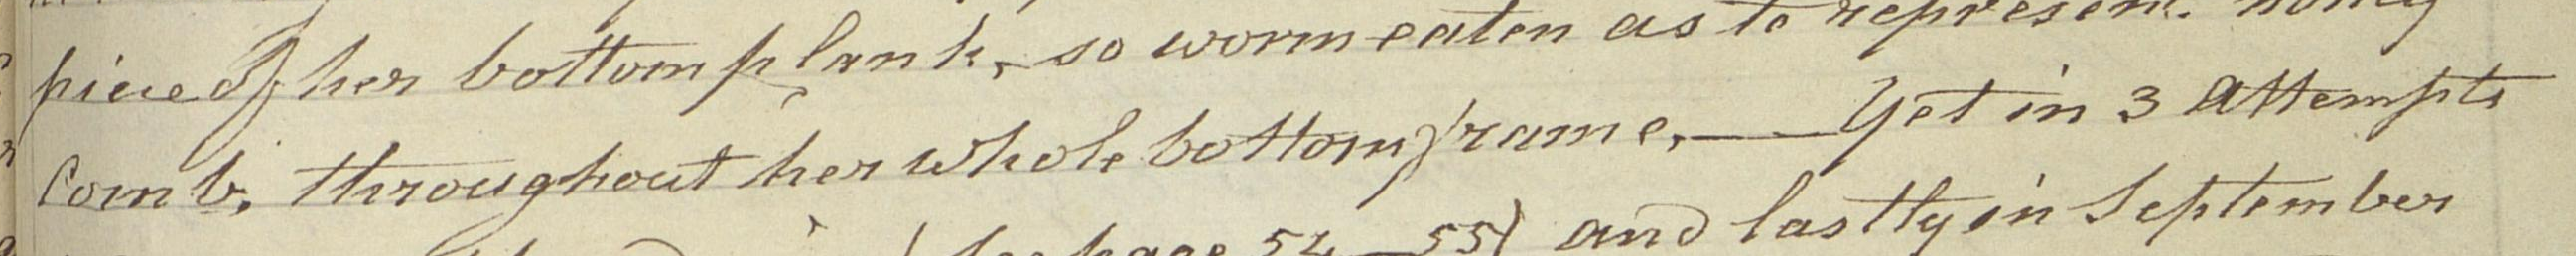comb, throughout her whole bottom frame, yet in 3 attempts
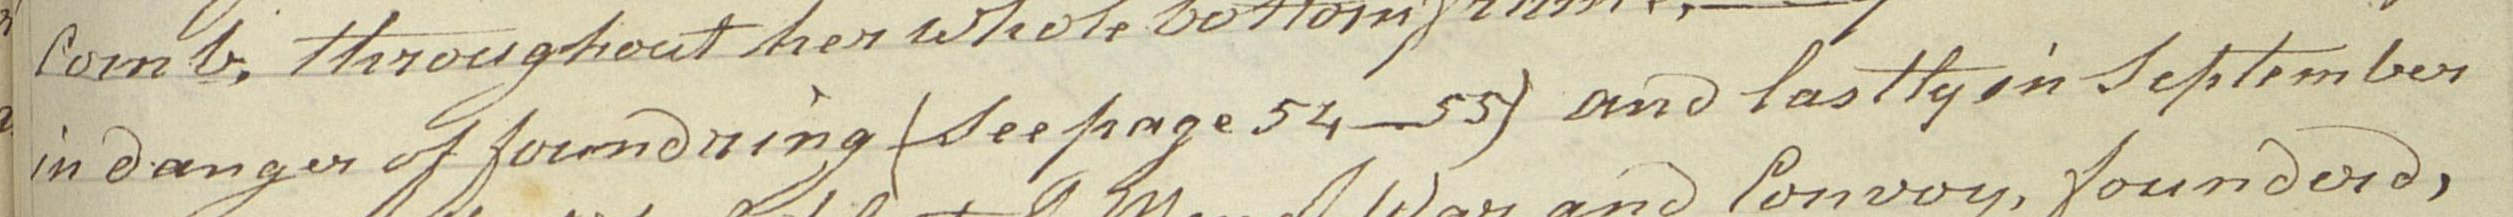in danger of dounring (See page 54-55) and lastly in September
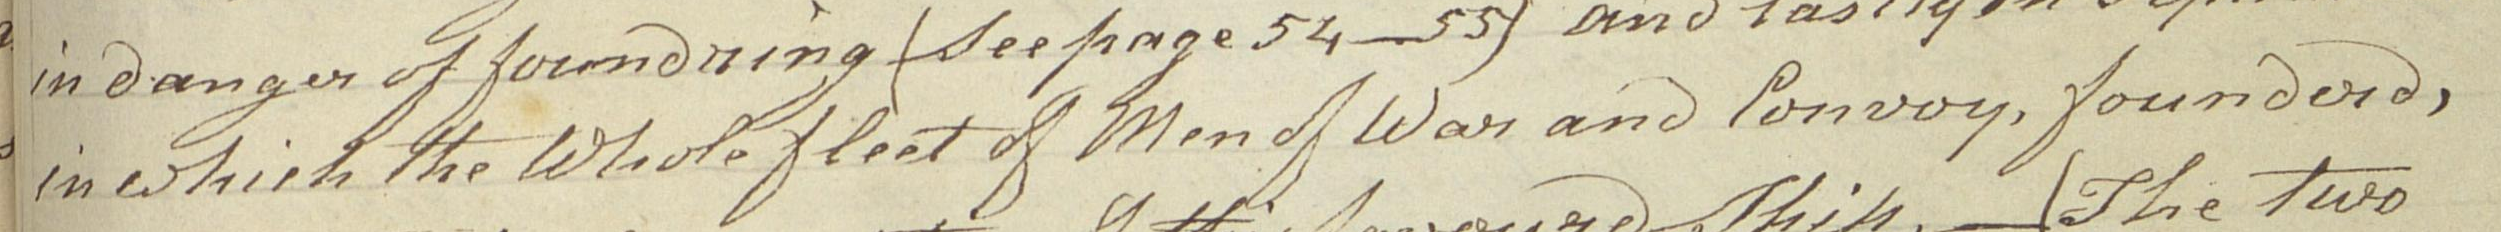in which the whole fleet of Men of War and Convoy, founderd,
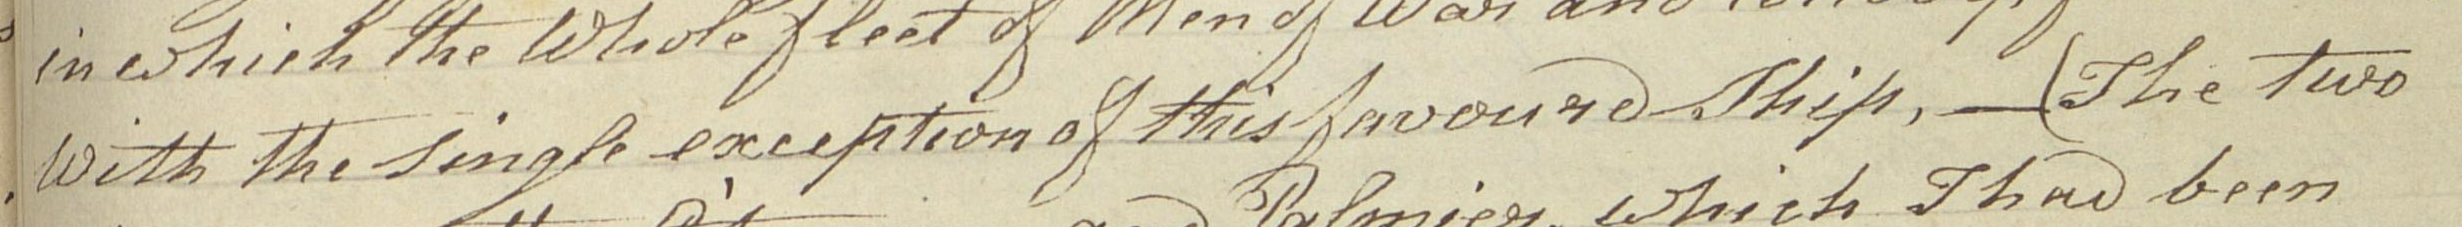With the single exception of this favourd Ship, (The two
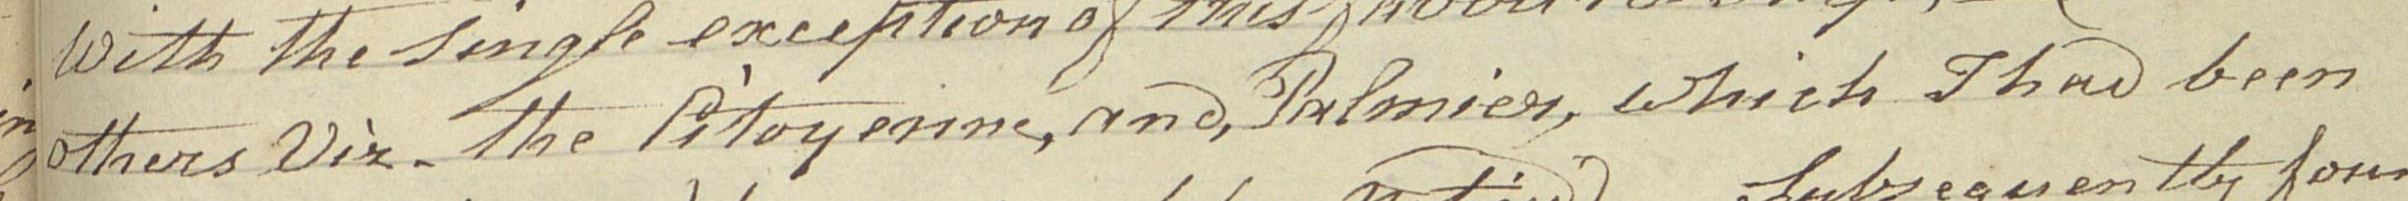other viz. the Citoyenne, and Palmier, which I had been
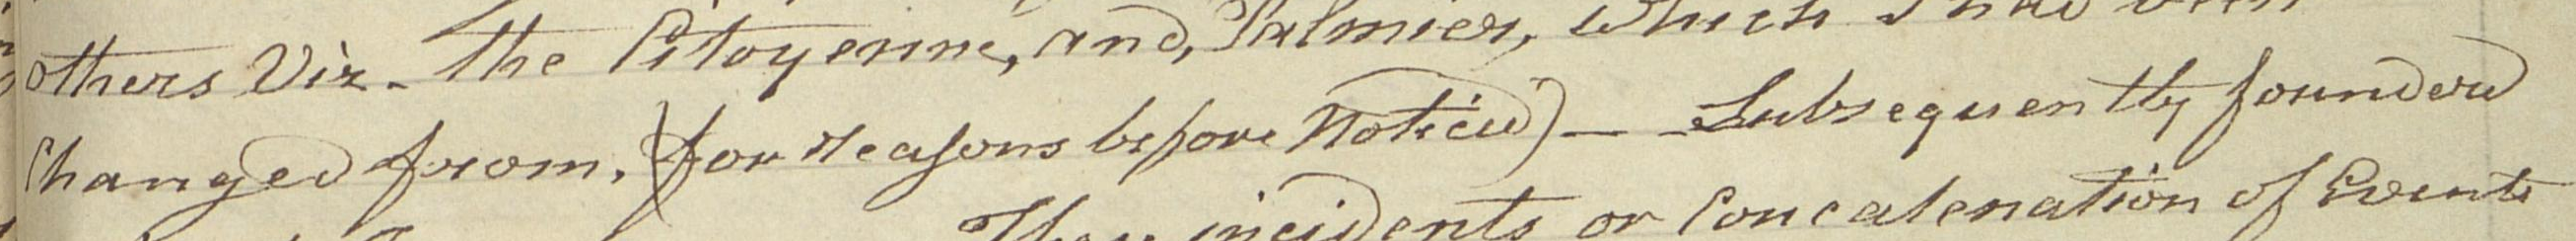changed from, (for reasons before noticed) subsequently founderd
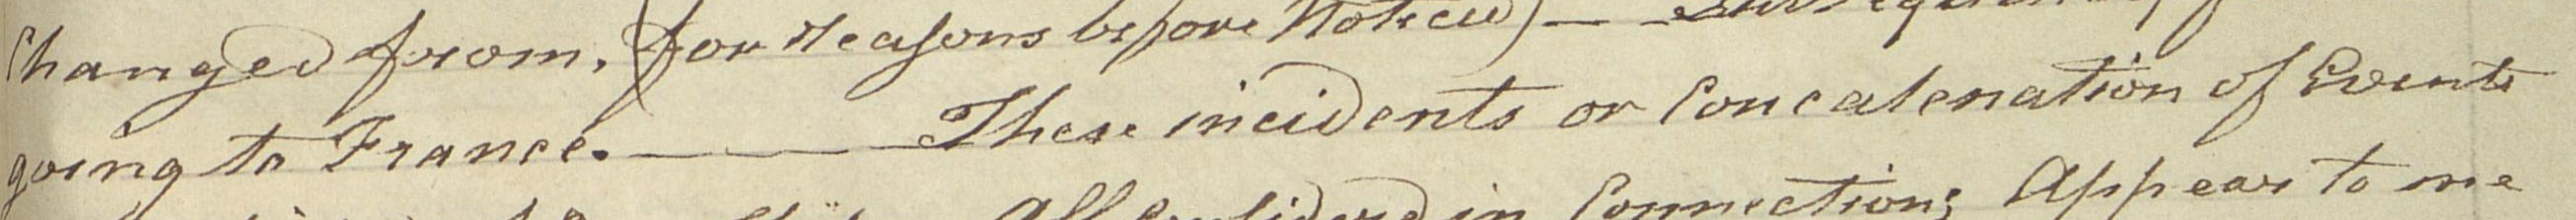going to France. These incidents or concatenation of Events
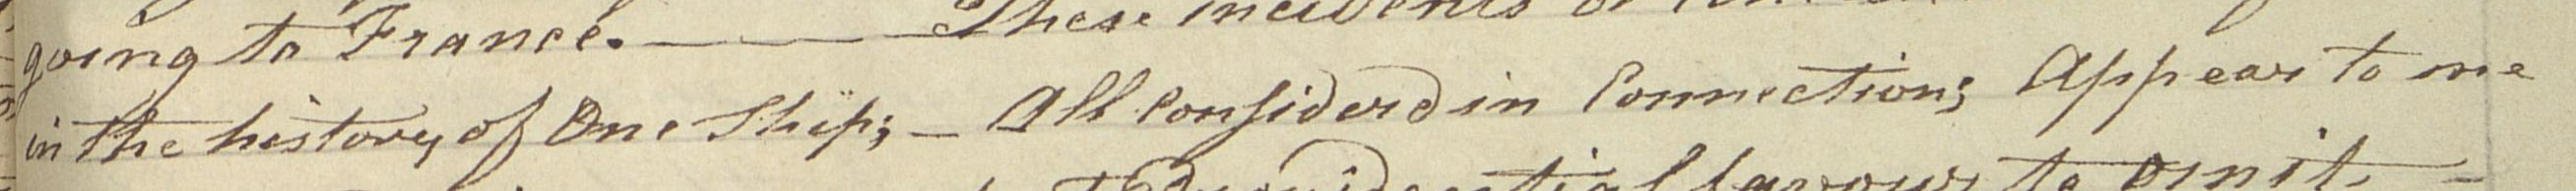in the history of one ship; all considerd in Connection; Appear to me
